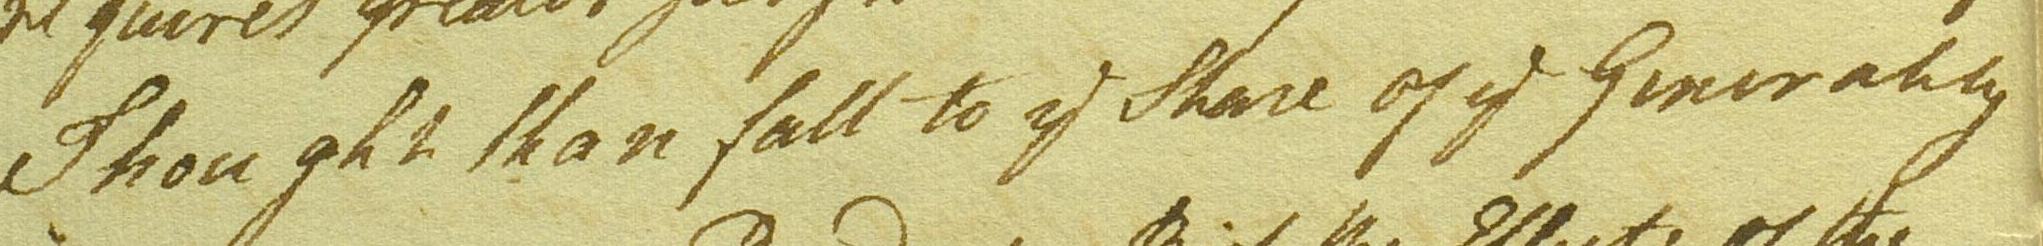Thought than fall to y^t Share of y^e Generality
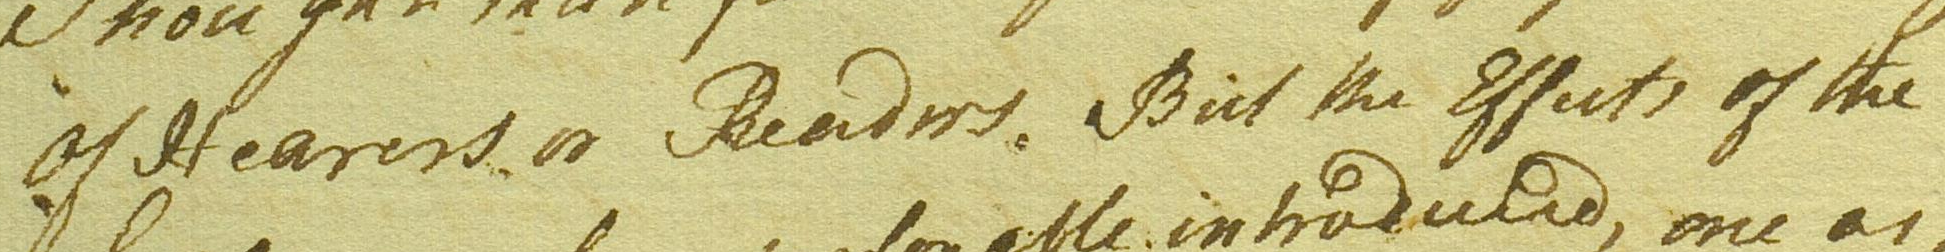of Hearers & Readers. But the Effects of the
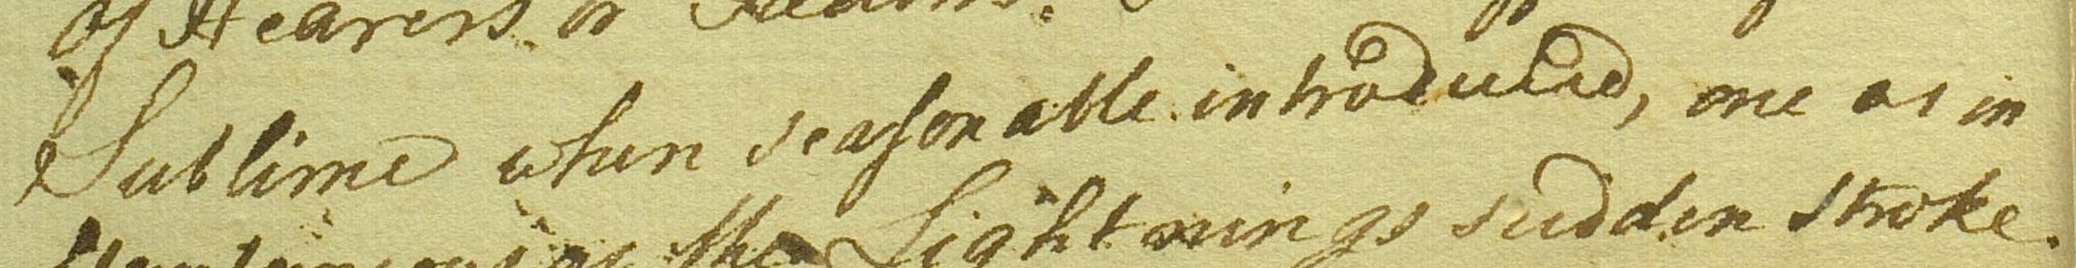Sublime when seasonable introduced, once as in
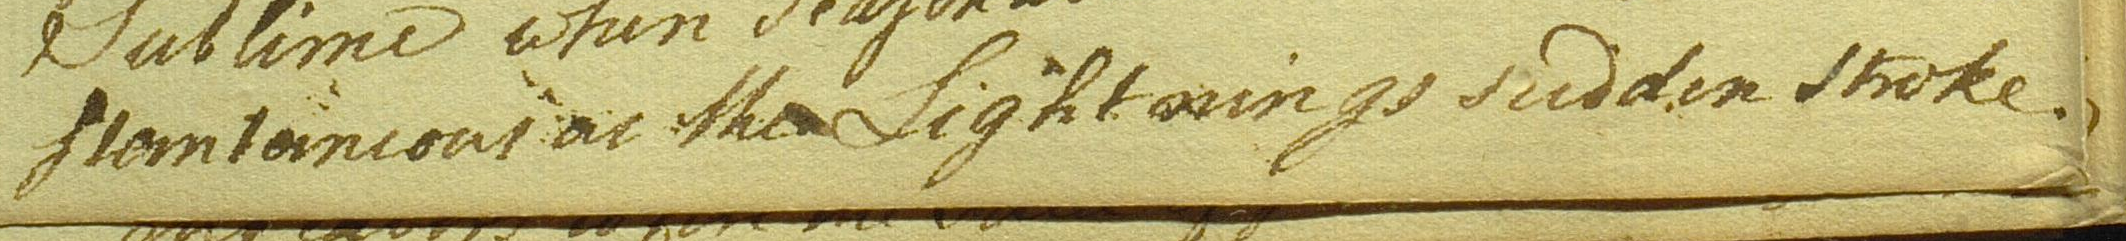flamtanious as the Lightnings sudden stroke.
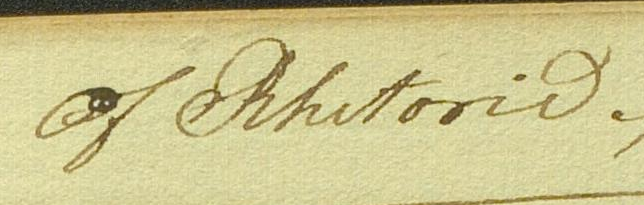Of Rhetoric
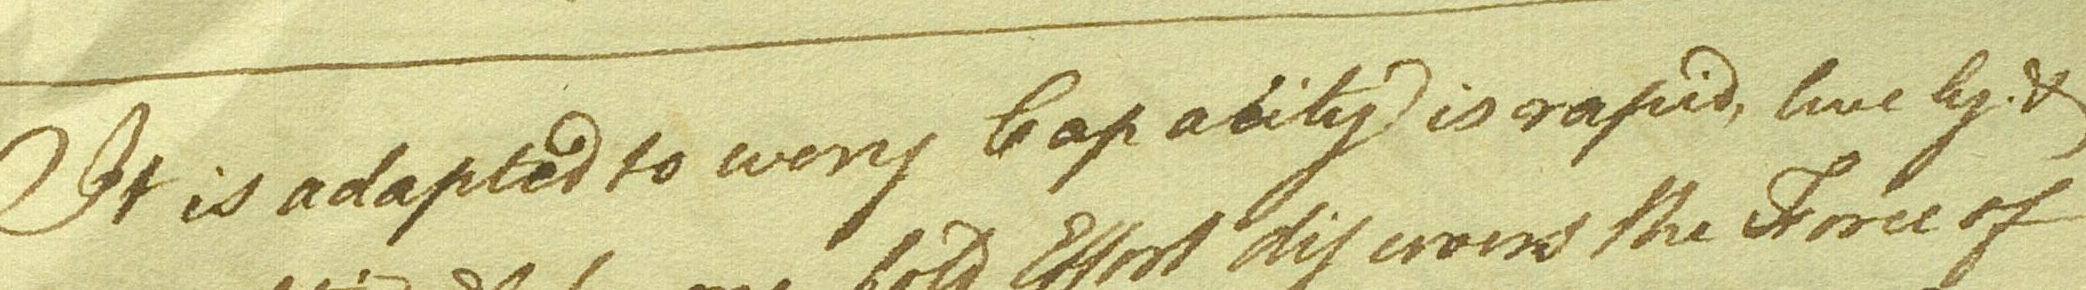It is adapted to every Capability is rapid, lively &
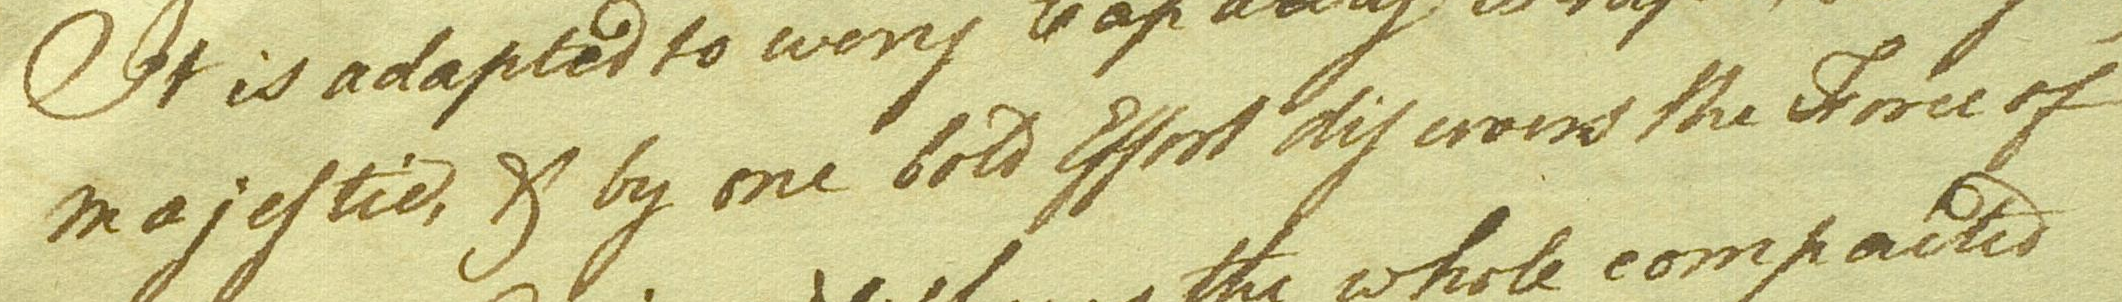majestic, & by one bold Effort discovers the Force of
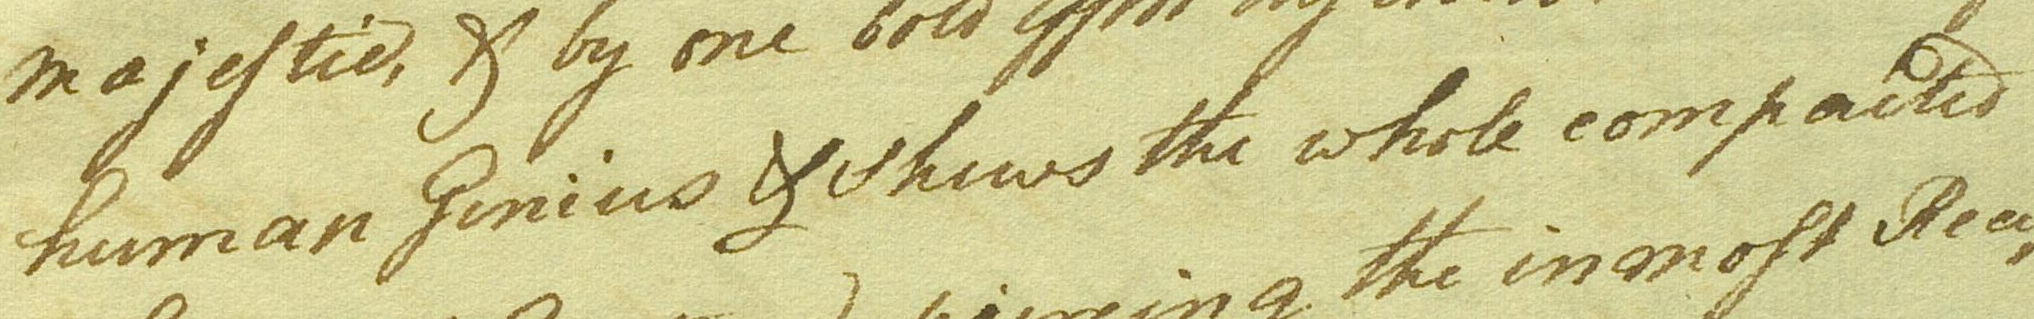human Genius & shews the whole compacted
